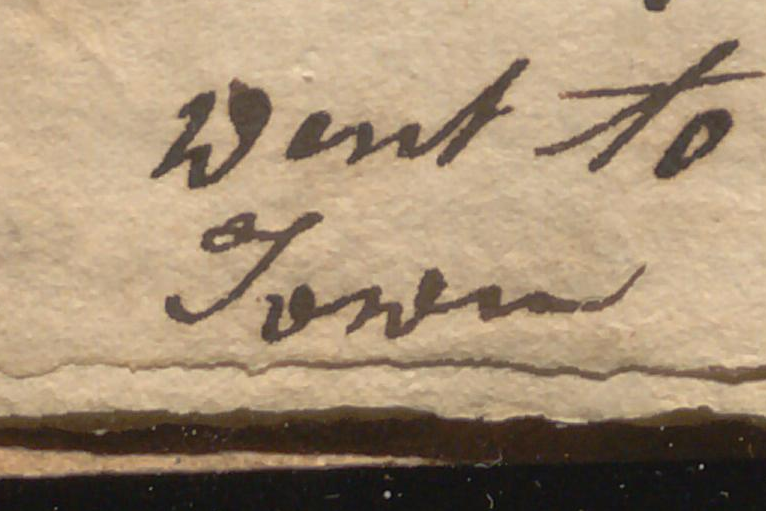Town
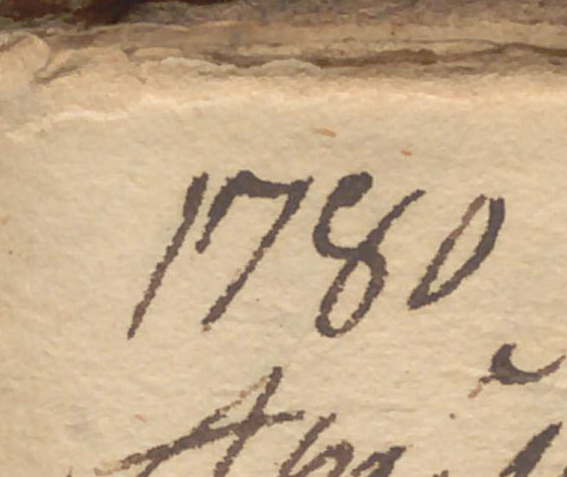1780
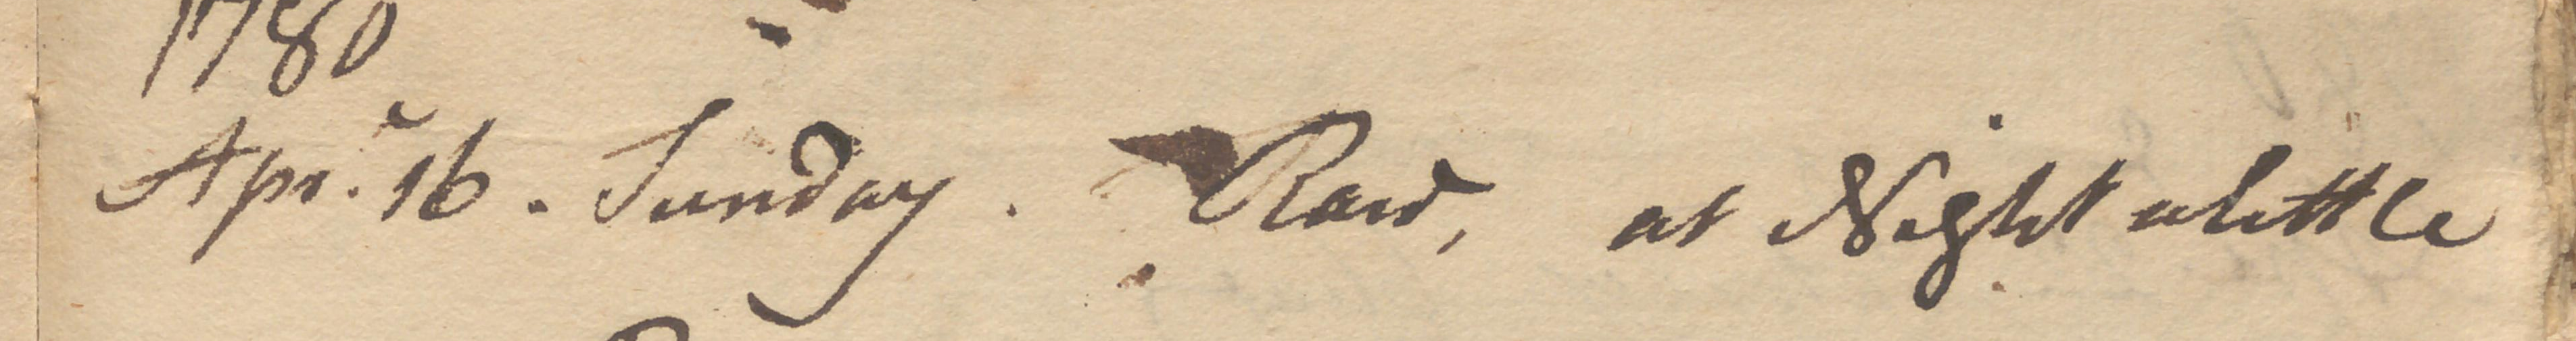Apr^l. 16h. Sunday. Raw, at Night a little
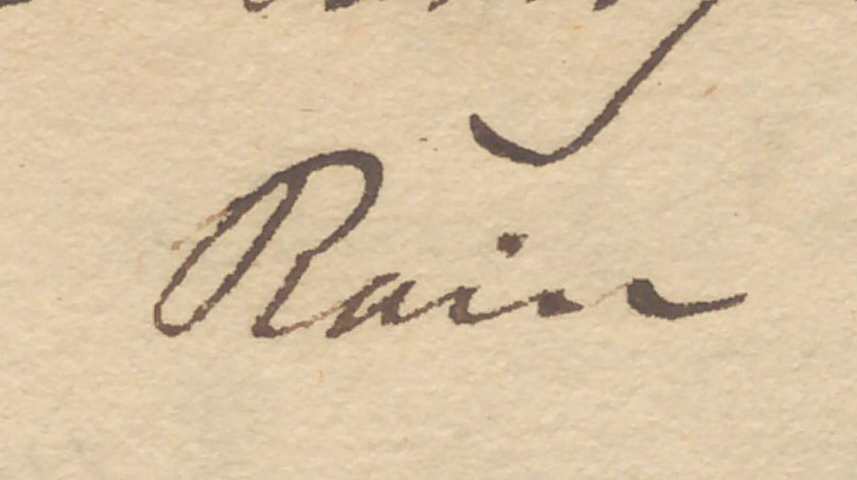Rain
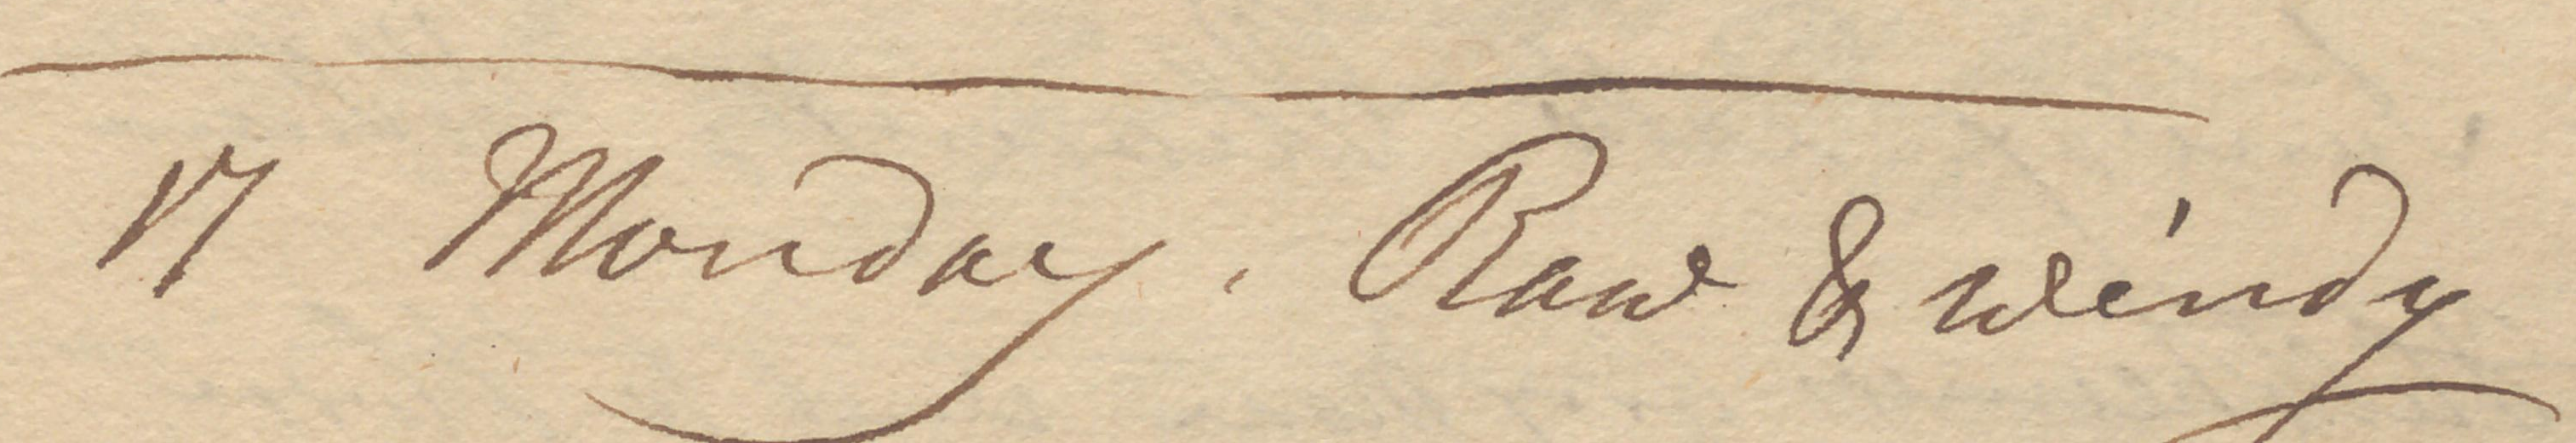17 Monday. Raw & windy
